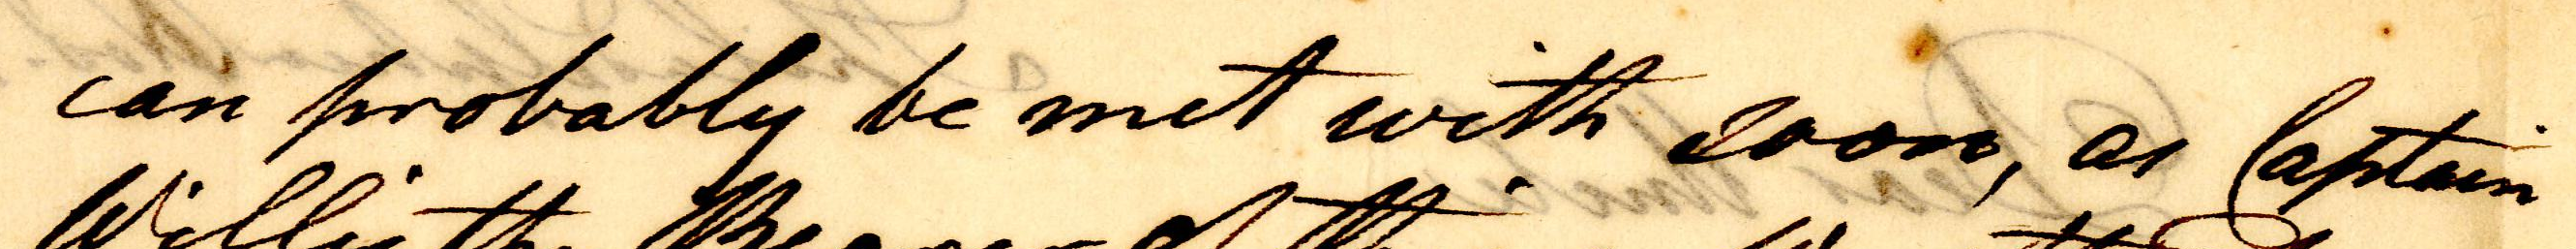can probably be met with soon, as Captain
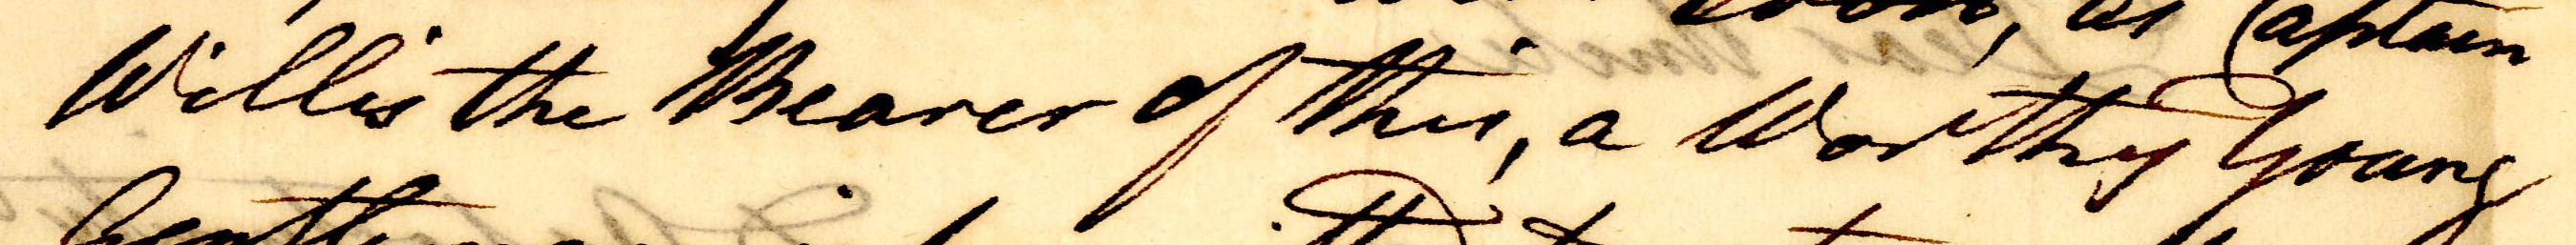Willis the Bearer of this, a Worthy Young
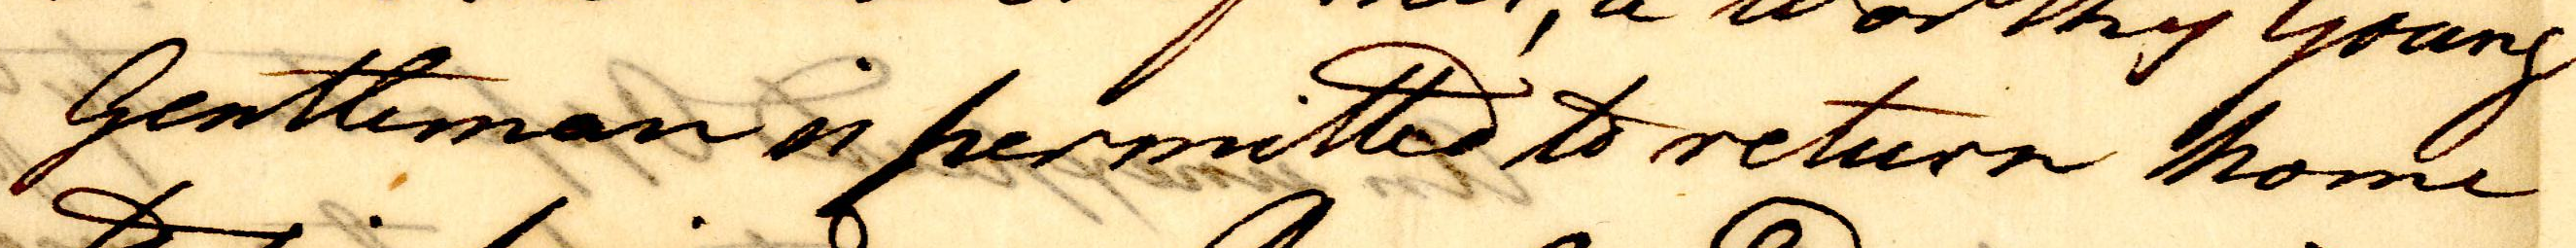Gentleman is permitted to return home
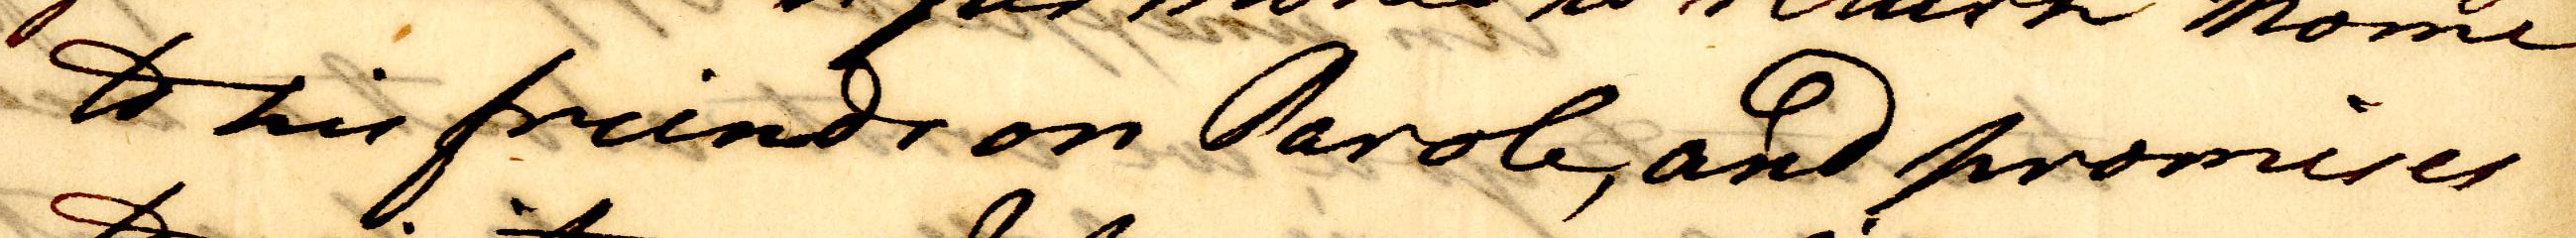to his friends on Parole, and promises
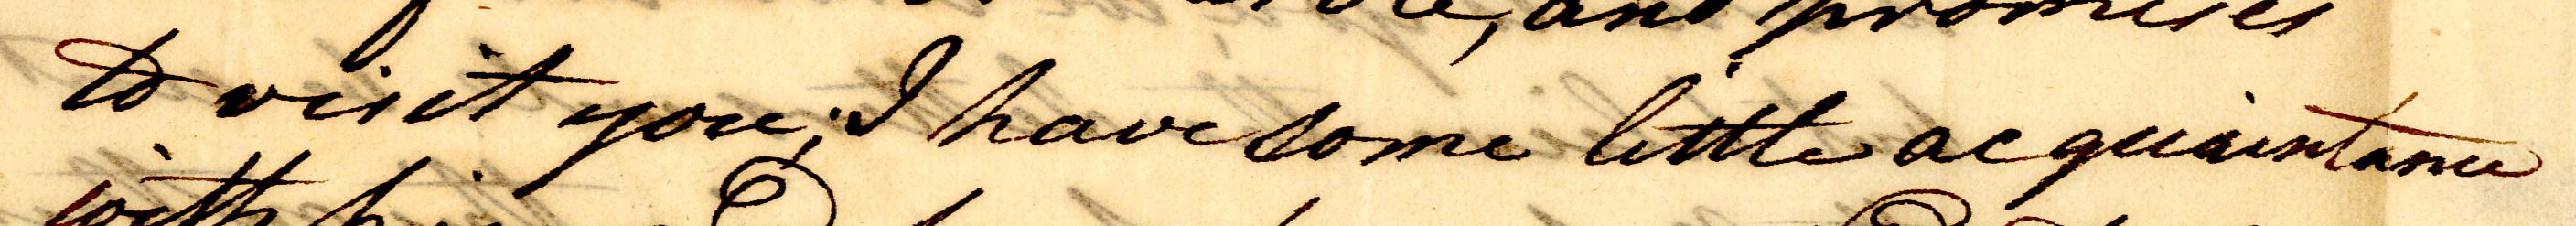to visit you; I have some little acquaintance
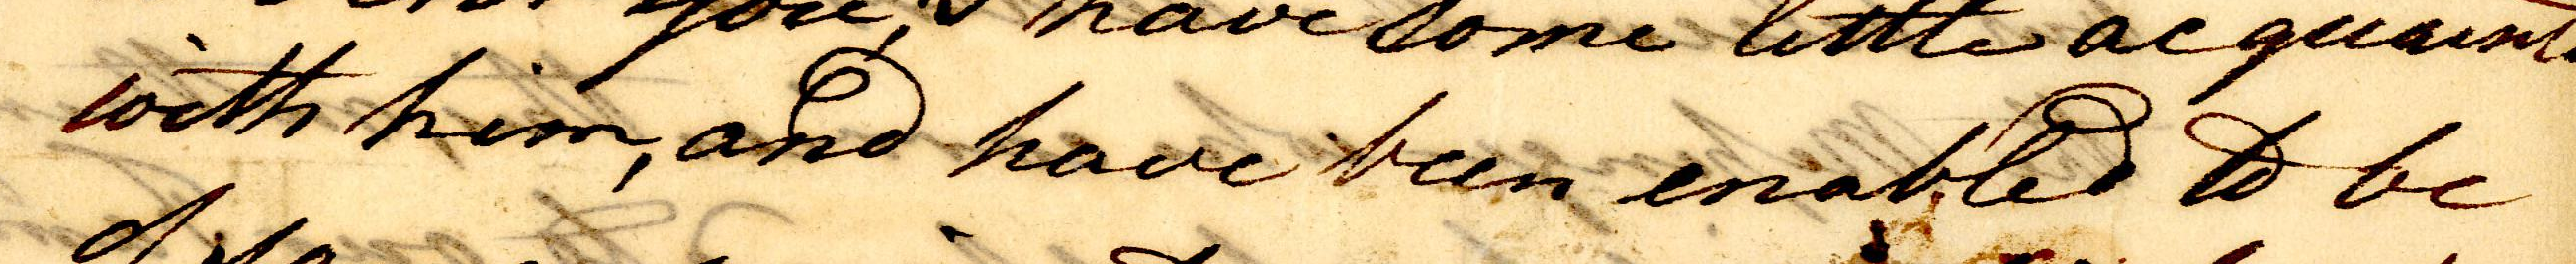with him, and have been enabled to be
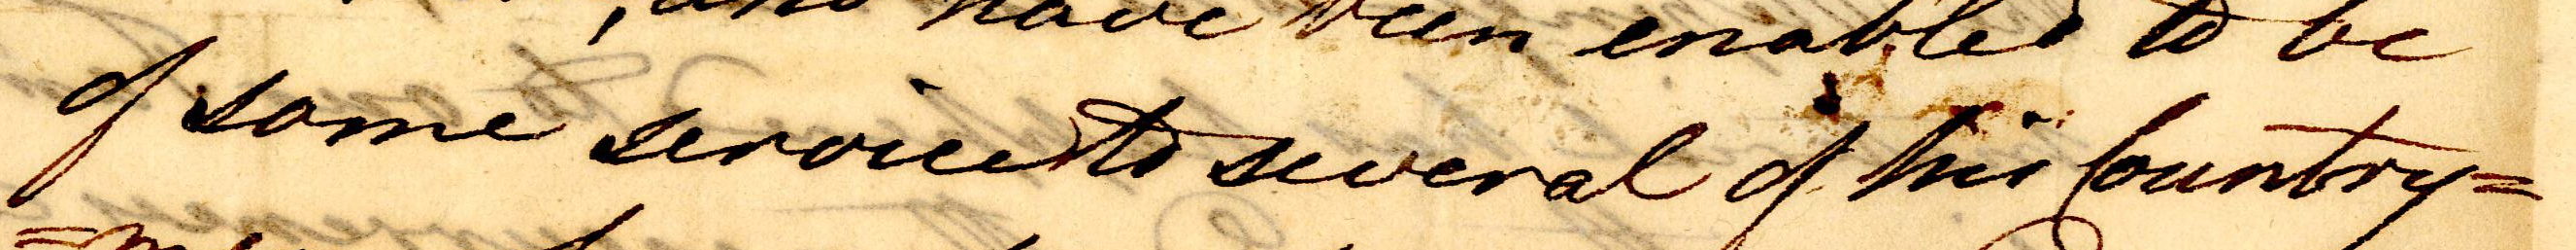of some service to several of his Country-
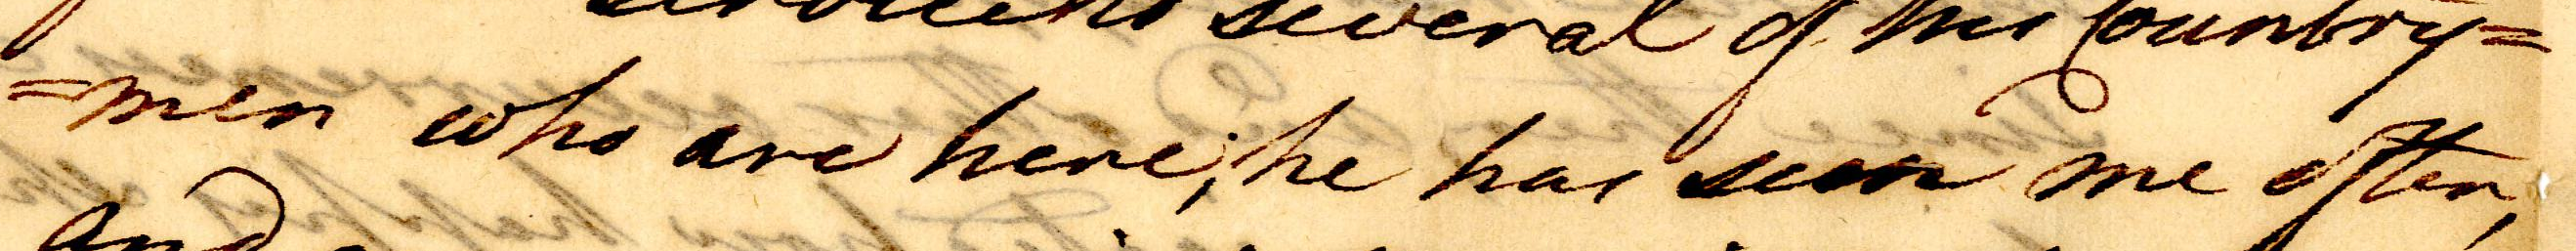-men who are here; he has seen me often,
